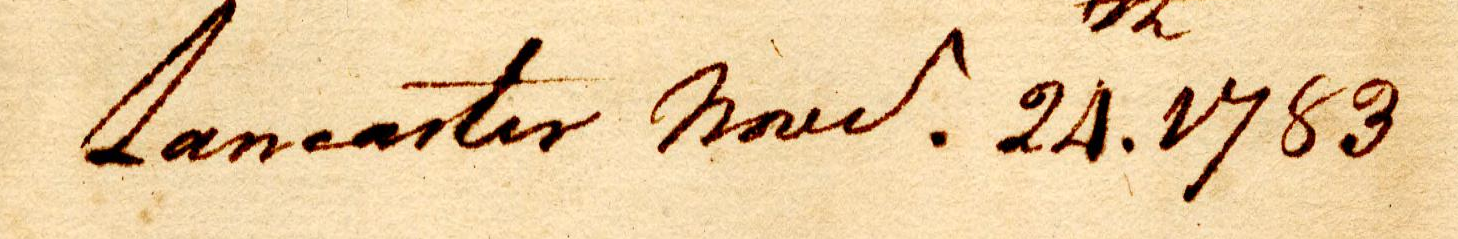Lancaster Nov^r. 24^th. 1783
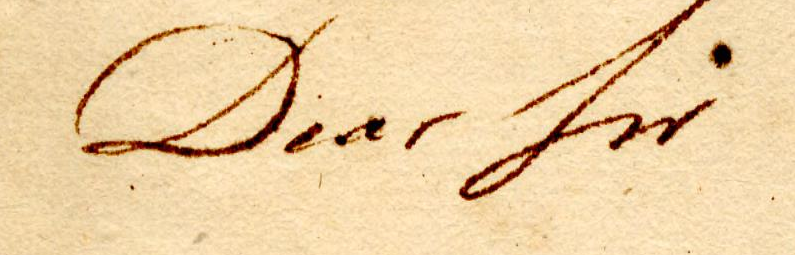Dear Sir
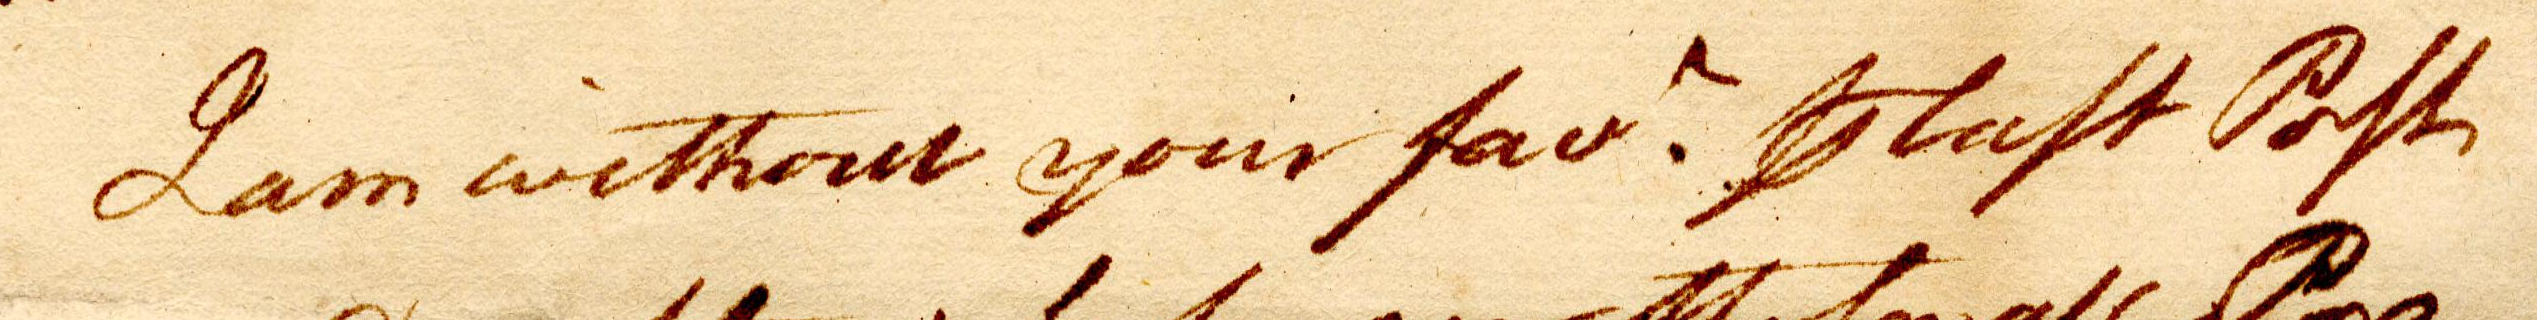I am without your fav^r. per last Post
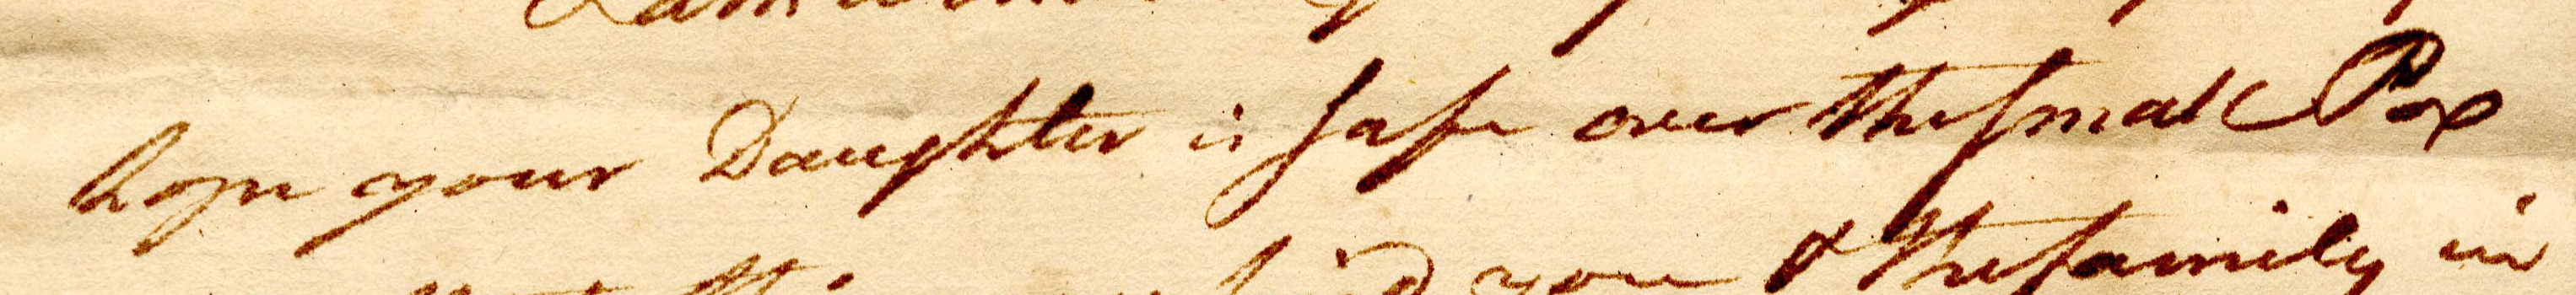hope your Daughter is safe over the small Pox
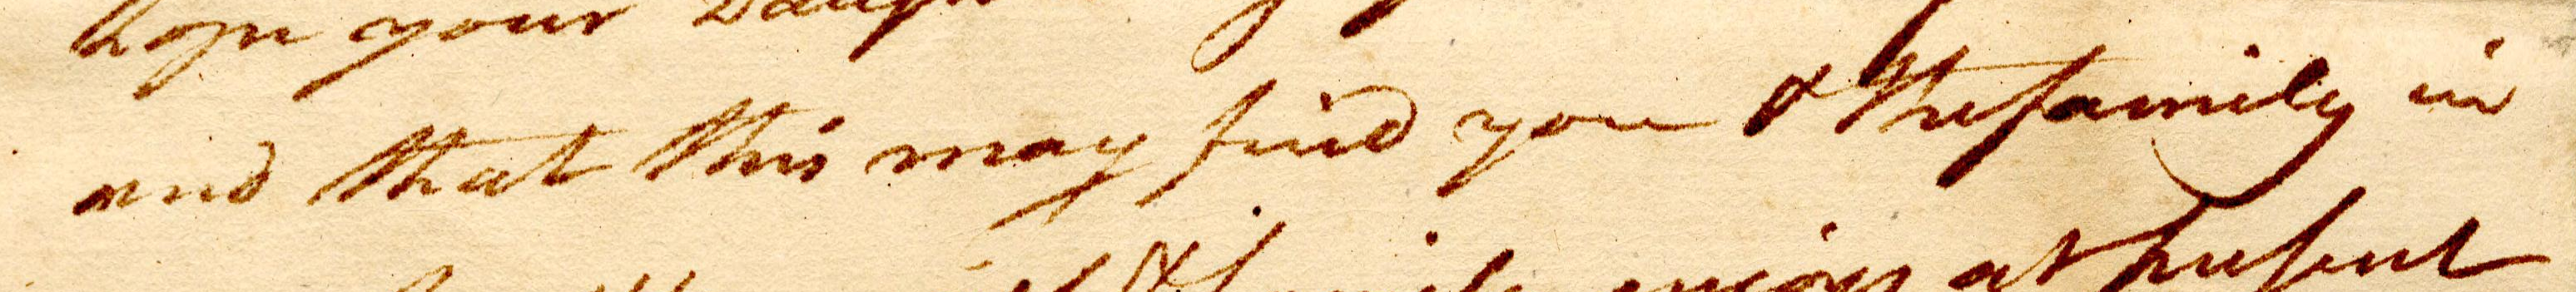and that this may find you & the family in
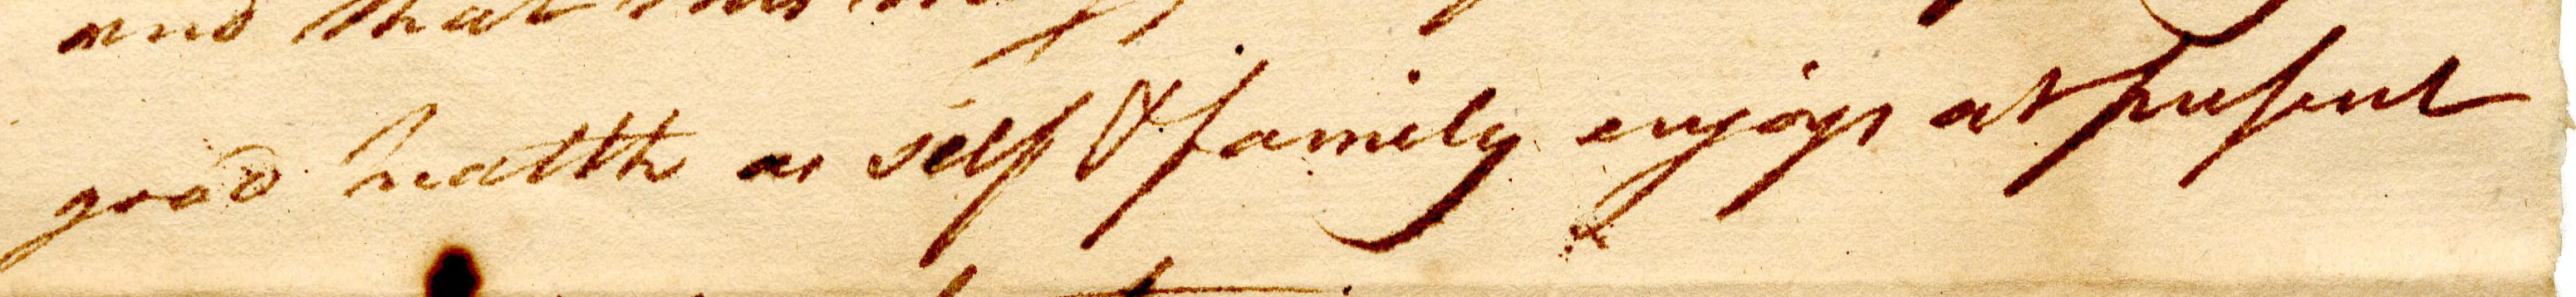good health as self & family enjoys at present
